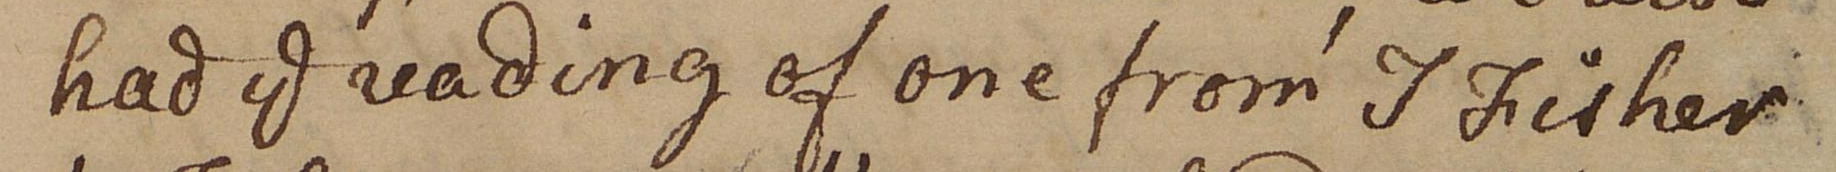had y^e reading of one from T Fisher
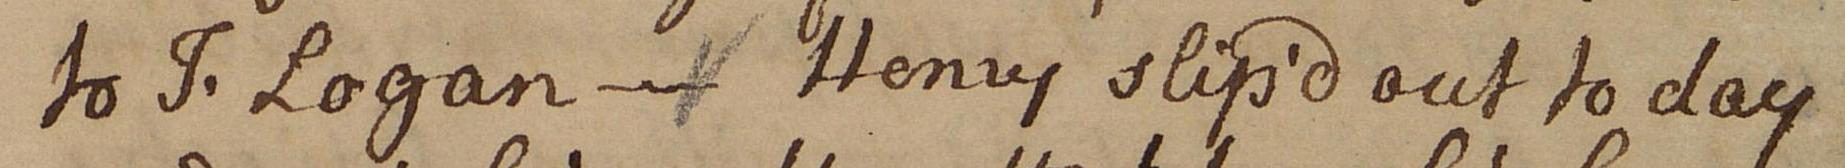to T. Logan- Henry slip'd out to day
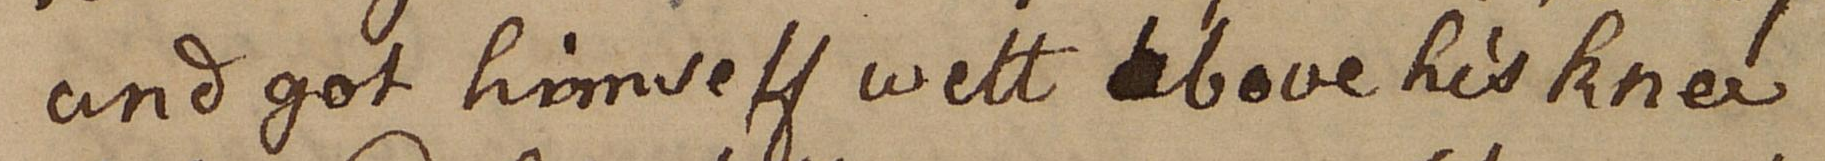and got himself wett above his knee
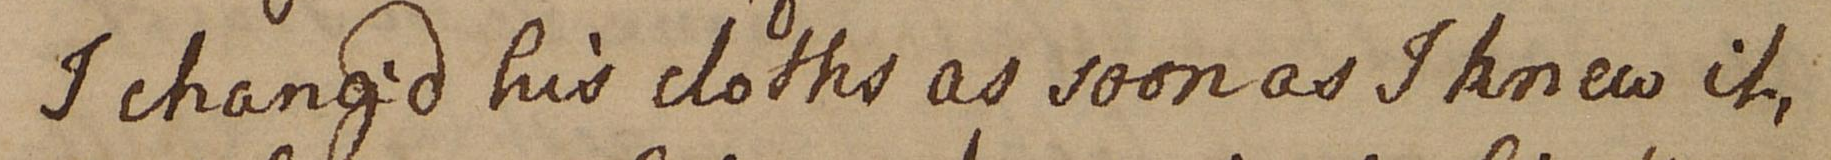I chang'd his cloths as soon as I knew it,
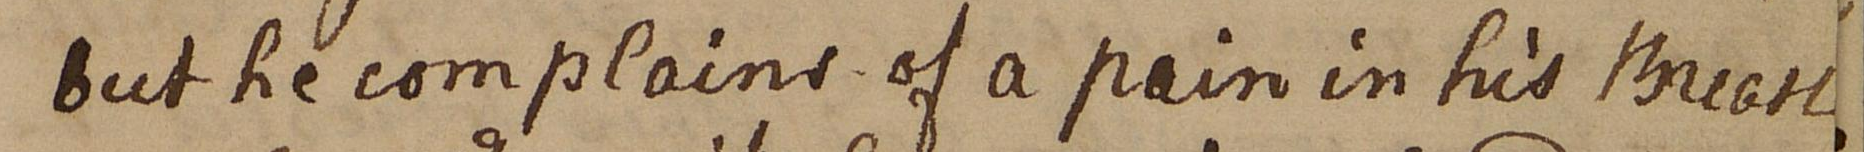but he complains of a pain in his Breast
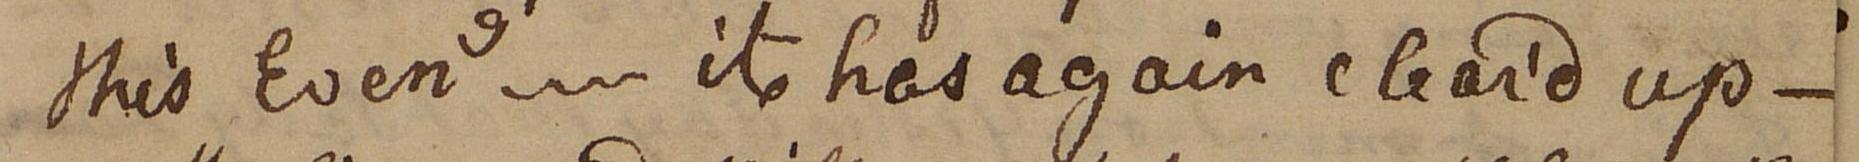this Even^g- it has again clear'd up-
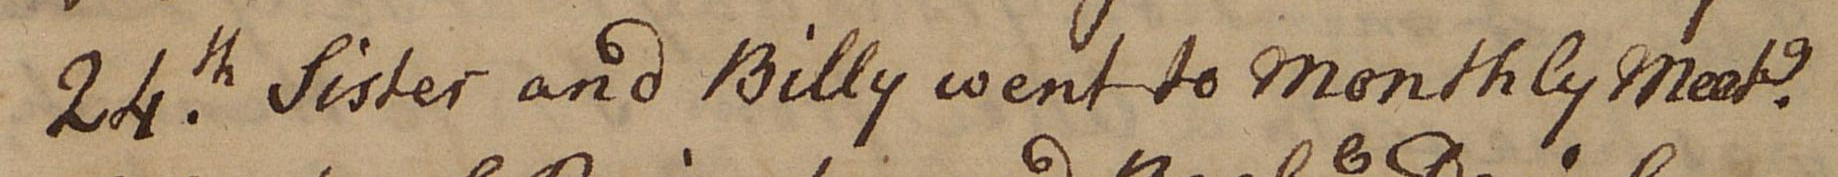24^th. Sister and Billy went to Monthly Meet^g.
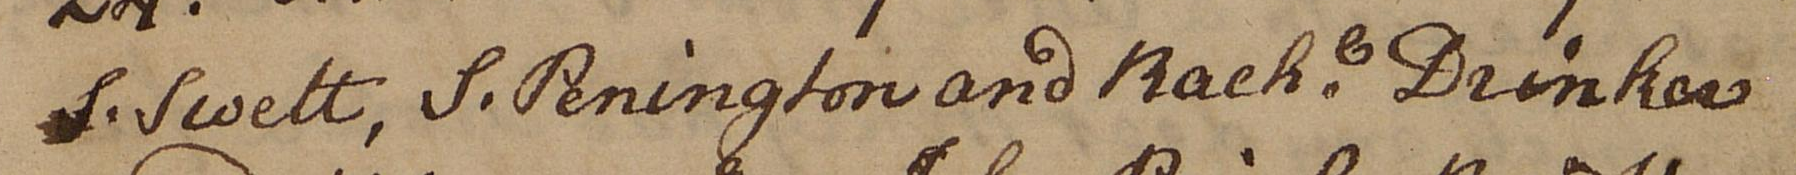S. Swett, S. Penington and Rach^l. Drinker
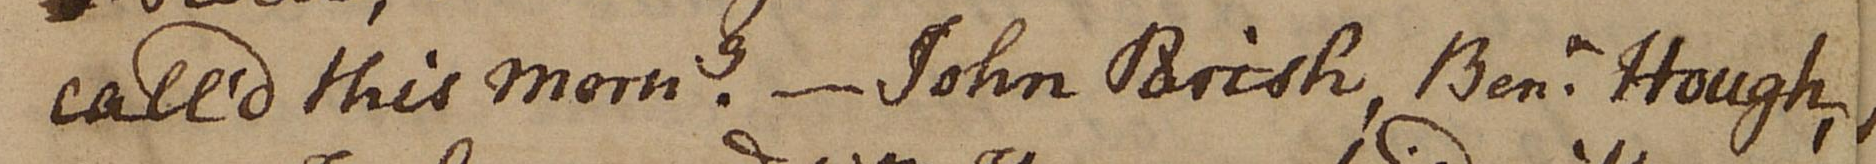call'd this morn^g.- John Parish, Ben^n. Hough,
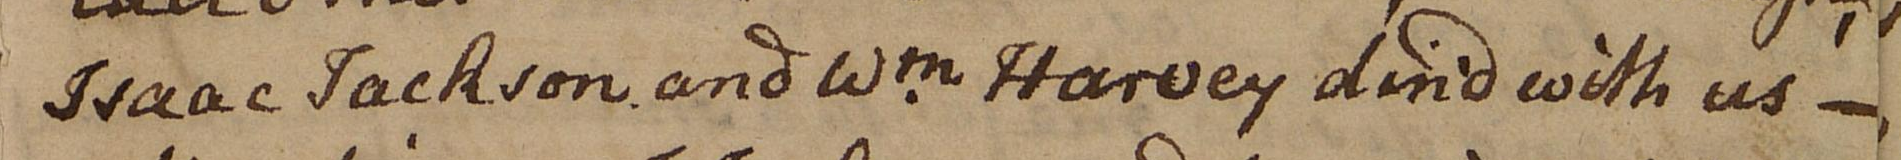Isaac Jackson and W^m. Harvey din'd with us-
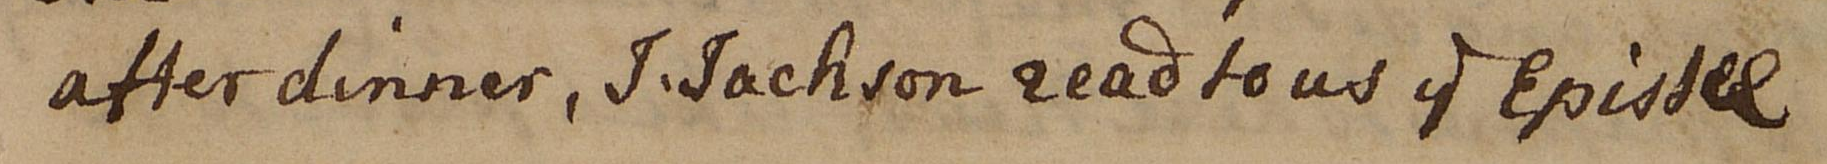after dinner, J. Jackson read to us y^e Epistle
